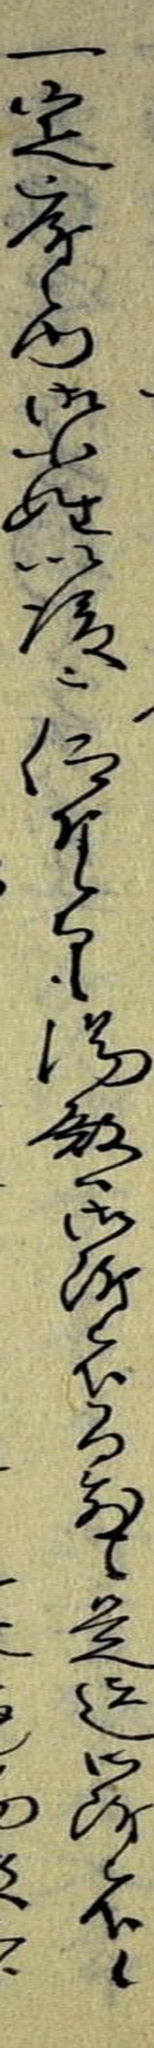一定府之内御小姓以後被仰付候而も湯殿は御附被下間敷候是迄御附被下候
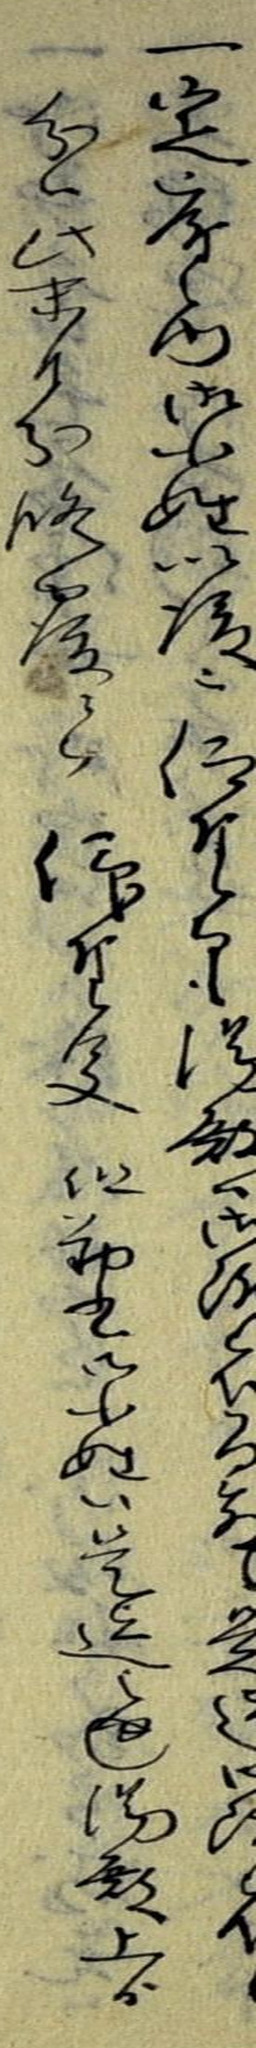分は此末自分修覆に被仰付候事但勤書御小姓は是迄之通湯殿へ上ゟ
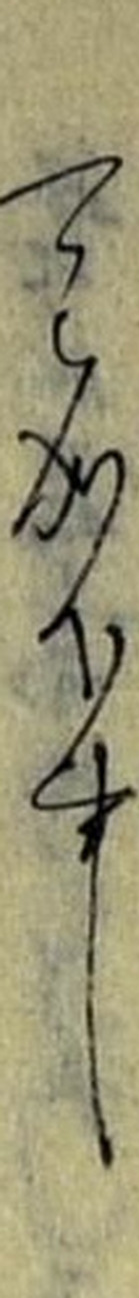可被成下事
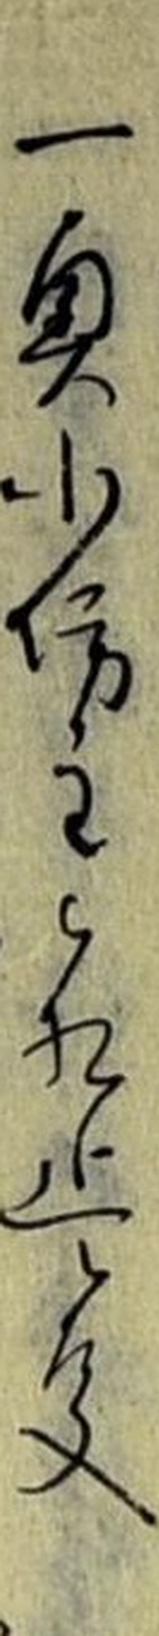一奥小坊主被相止候事
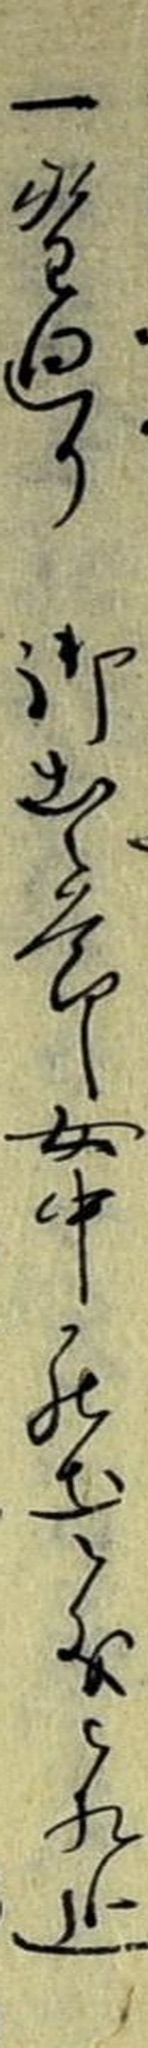一野廻り御出之節女中罷出候義被相止
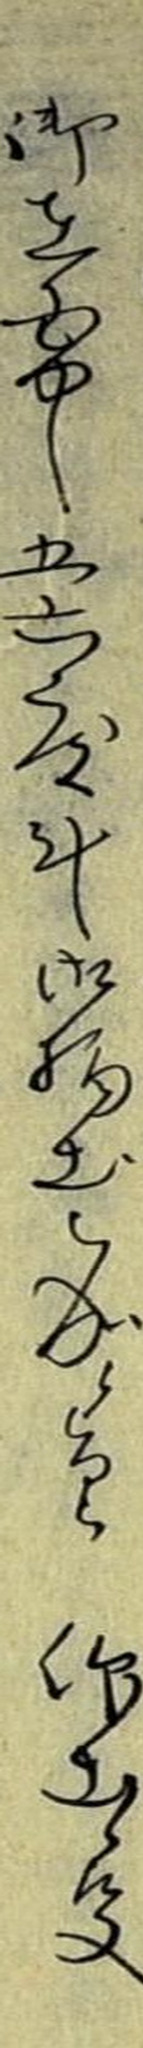御在国中五六度斗御指出被成候旨被仰出候事
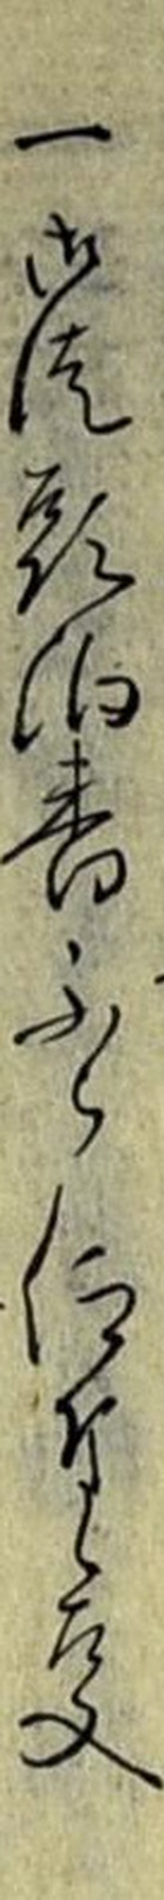一御徒頭泊番不被仰付候事
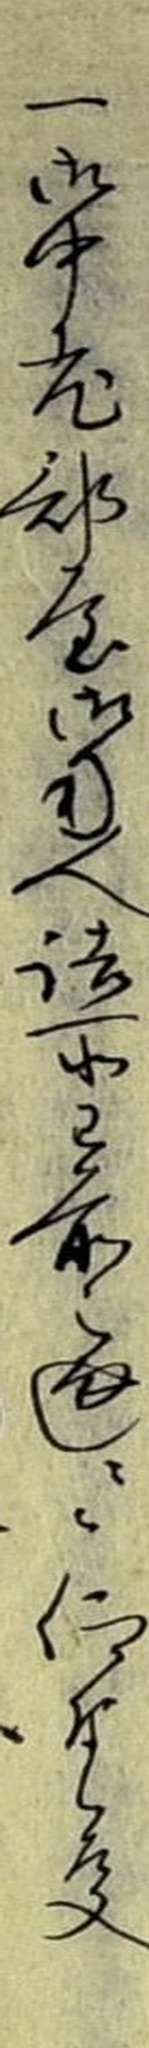一御中老部屋御用人詰所已前之通に被仰付候事
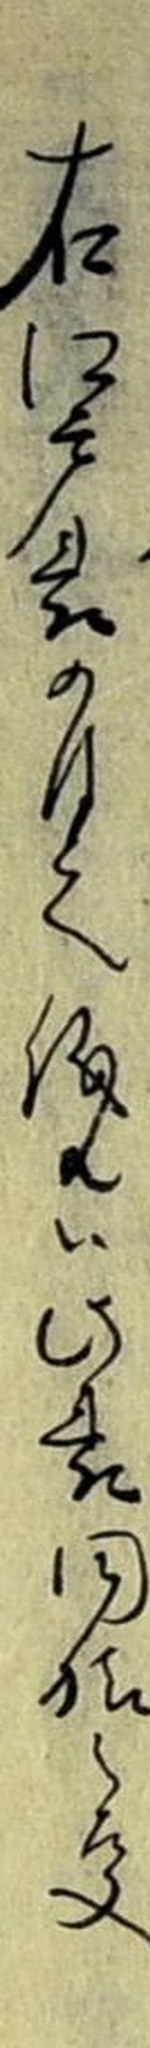右江戸表有之儀共は此表同様之事
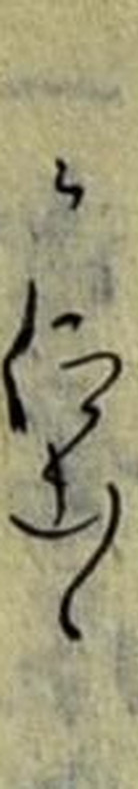被仰出候
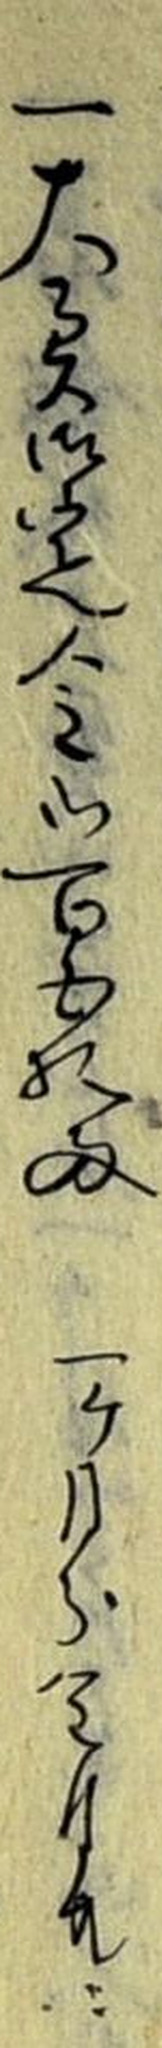一大奥御定金弐百五拾両一ヶ月分閏月共に
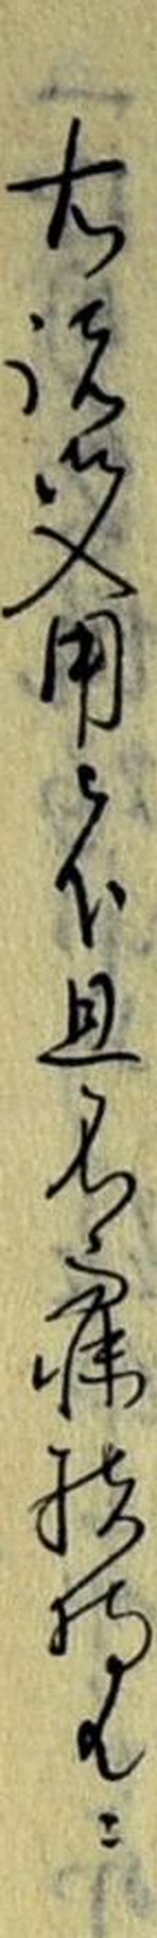右諸御入用被下且不寝扶持共に

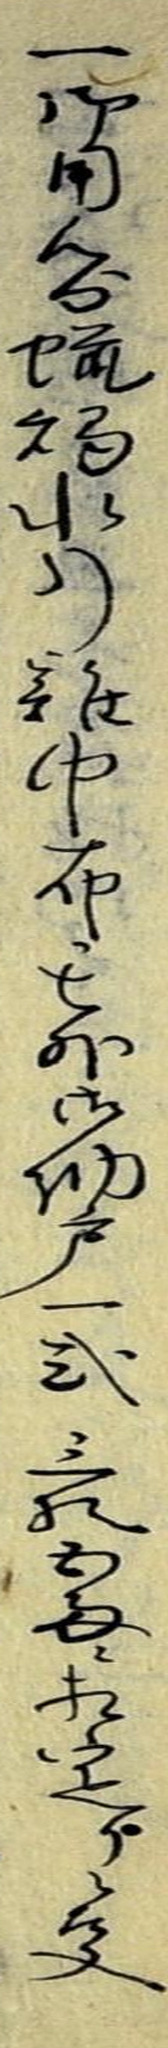一御用紙蝋燭水引雑巾布其外御納戸一式三拾五両に相定り候事
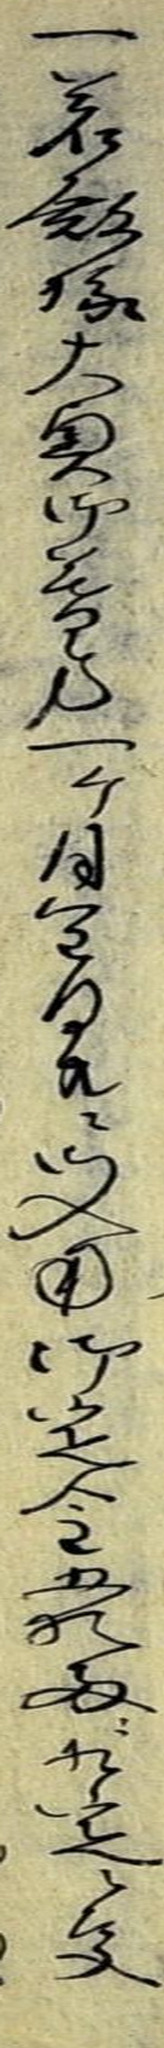一若殿様大奥御暮方一ヶ月閏月共に御入用御定金五拾両に相定候事
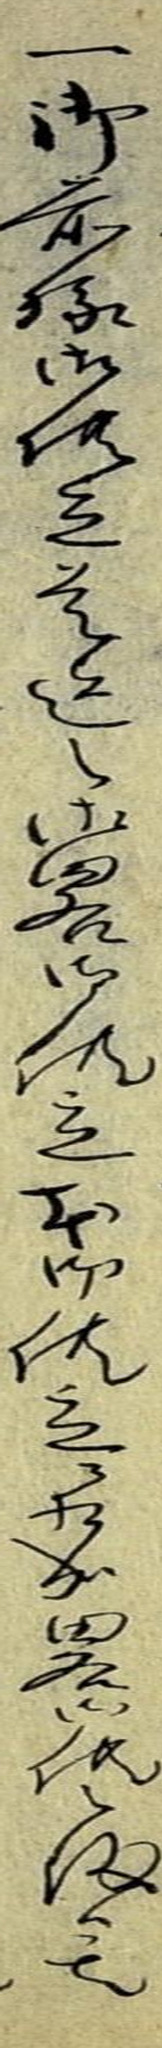一御前様御供立是迄之御略御供立本御供立に相成略御供之儀は其
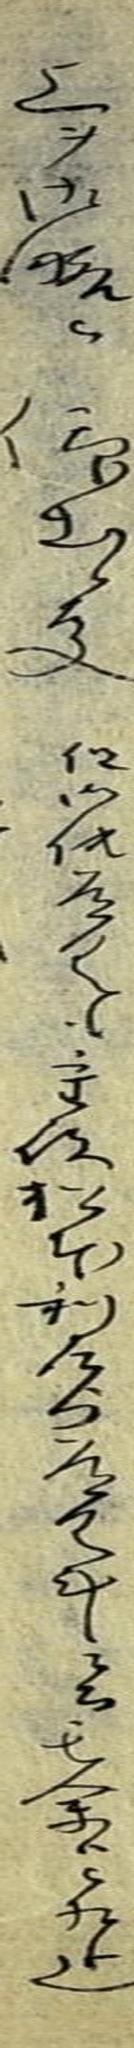上を御略被仰出候事但御能道具も重役松本利左衛門道具斗に而其余は被相止候事
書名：命令之部 二
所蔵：福井県文書館 Fukui Prefectural Archives
